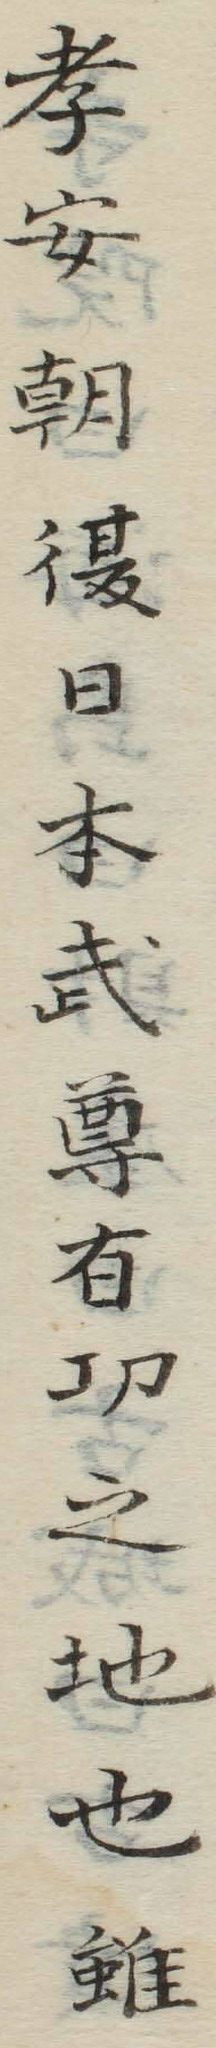考安朝後日本武尊有功之地也雖
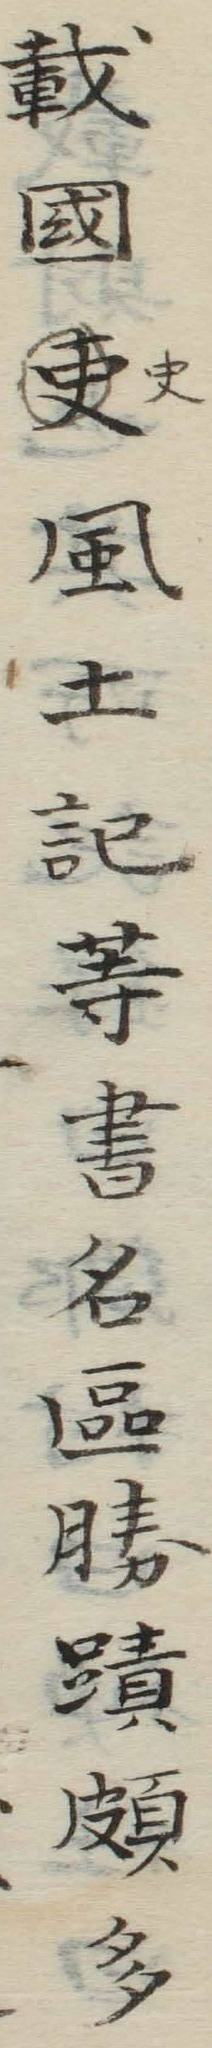載国吏風土記等書名区勝蹟頗多
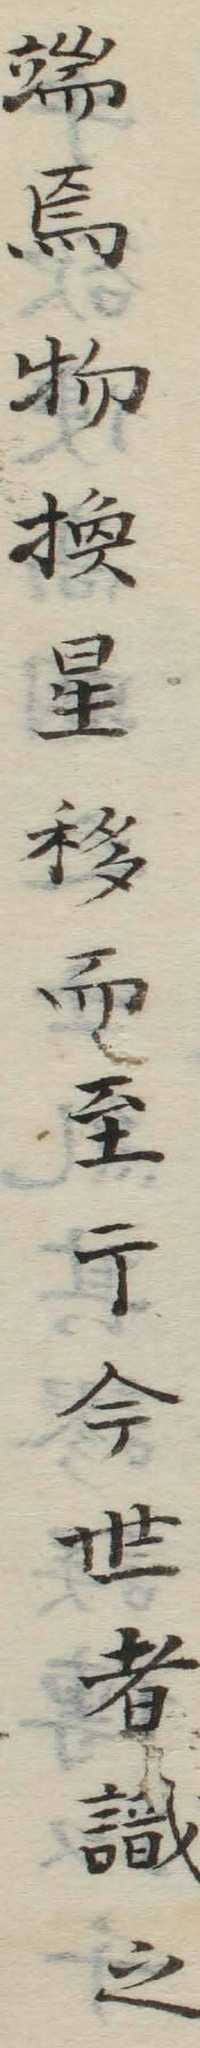端焉物換星移而至于今世者識之
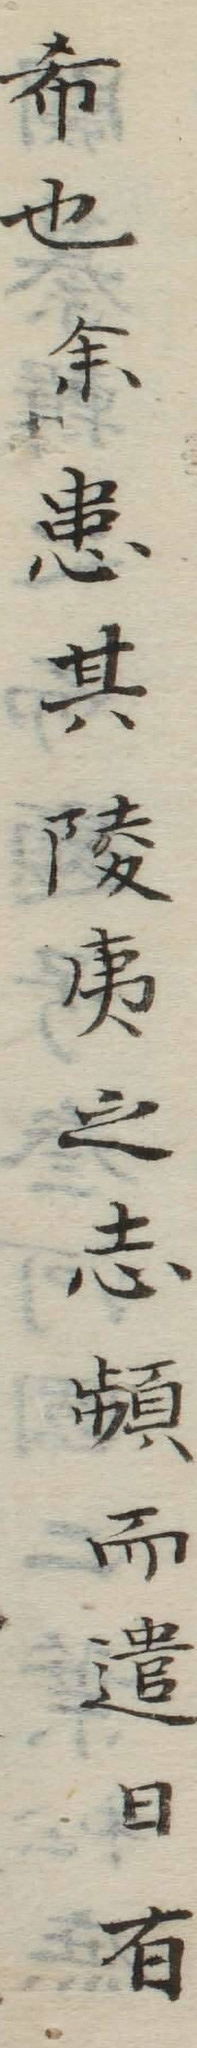希也余患其陵庚之志頻而遣日有
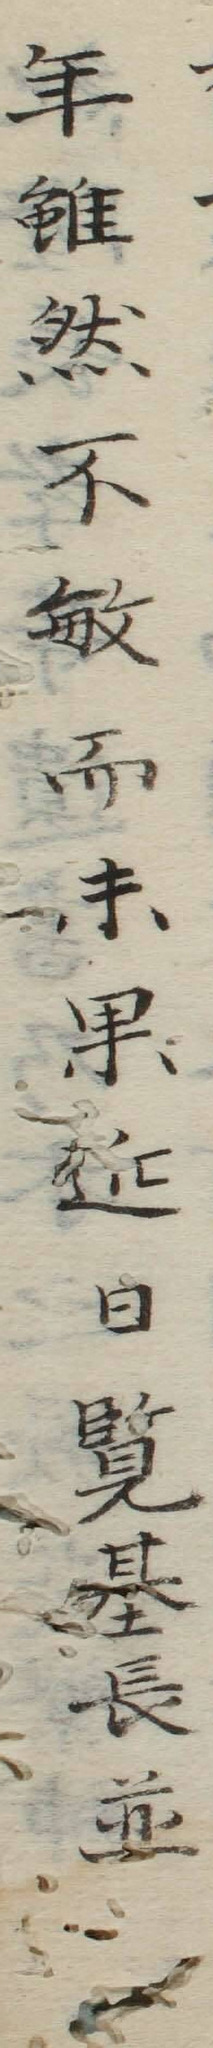年雖然不敏而未果近日覧其長並

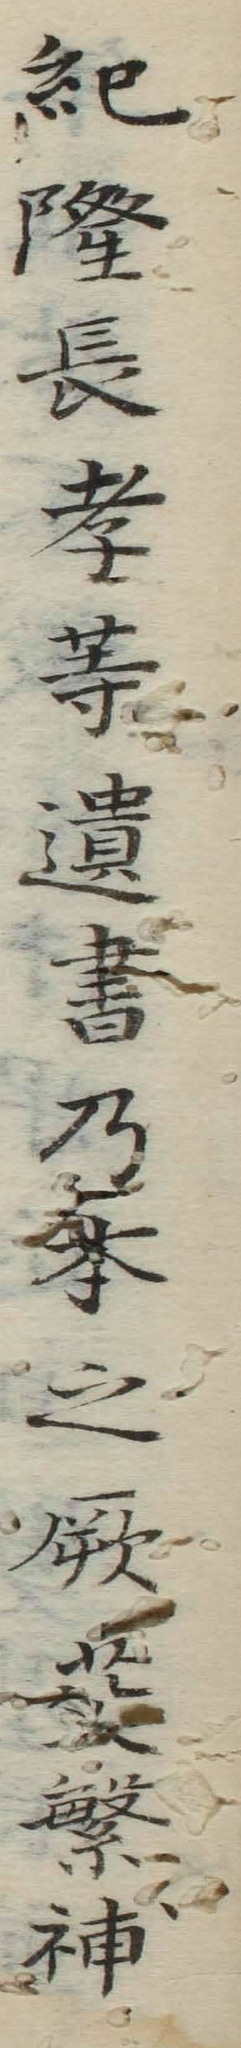紀隆長孝等遺書乃本乃厥芟繁補
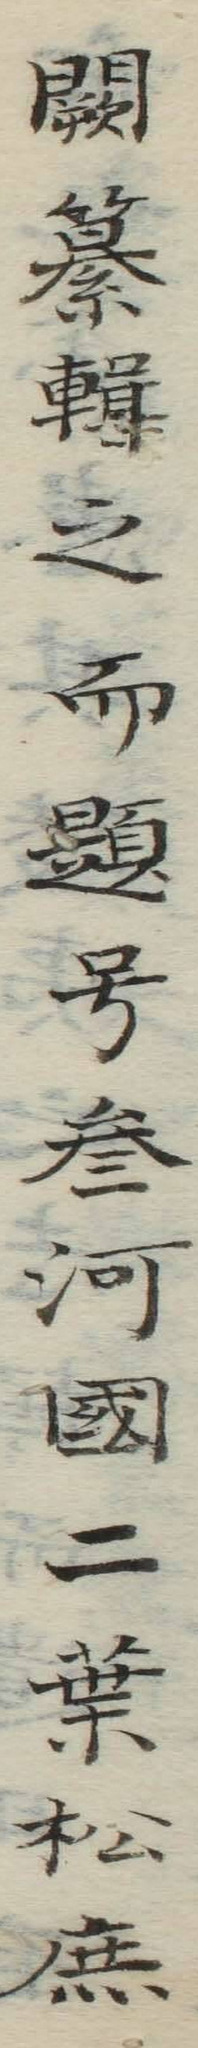闕纂輯之而題号参河国二葉松庶
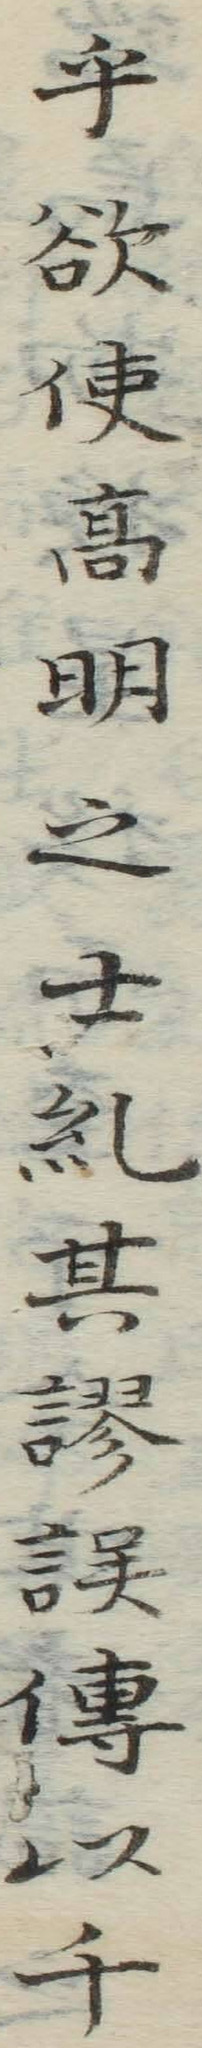乎欲使高明之士糺其謬誤伝以千
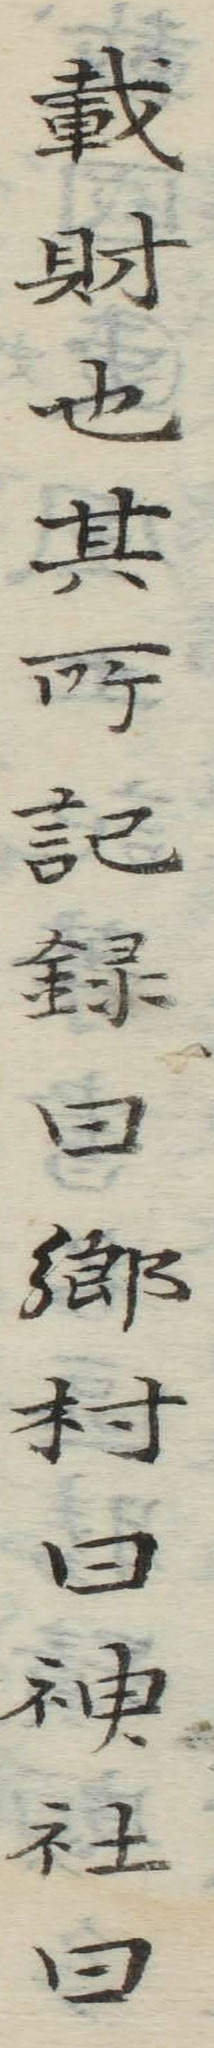載財也其所記録曰郷村曰神社曰
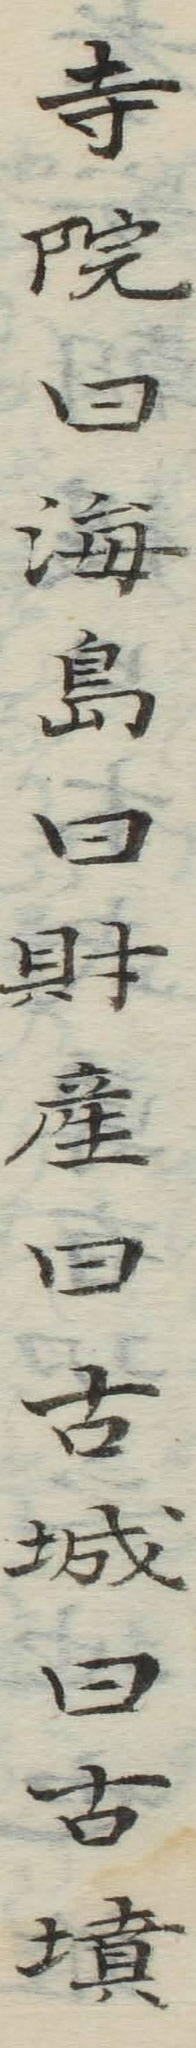寺院曰海島曰財産曰古城曰古墳
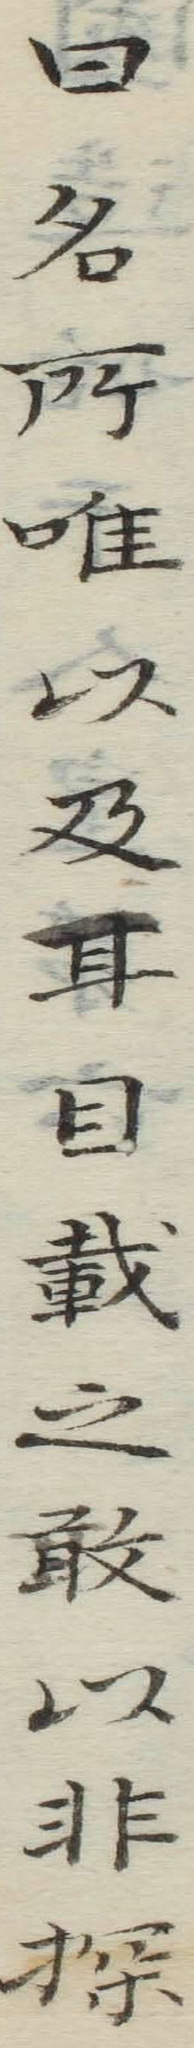曰名所唯以及耳目載之敢以非探
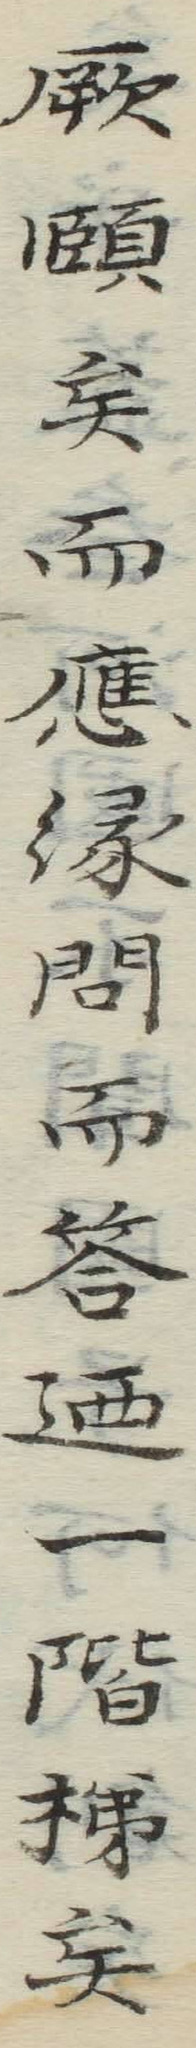厥頥矣而應縁問而答廼一階梯矣
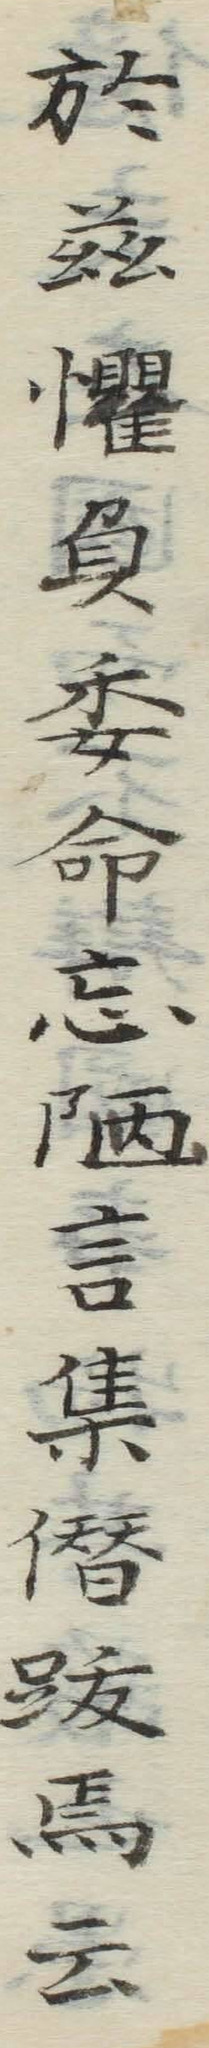於茲懼負委命忘陋言集僣跋焉云
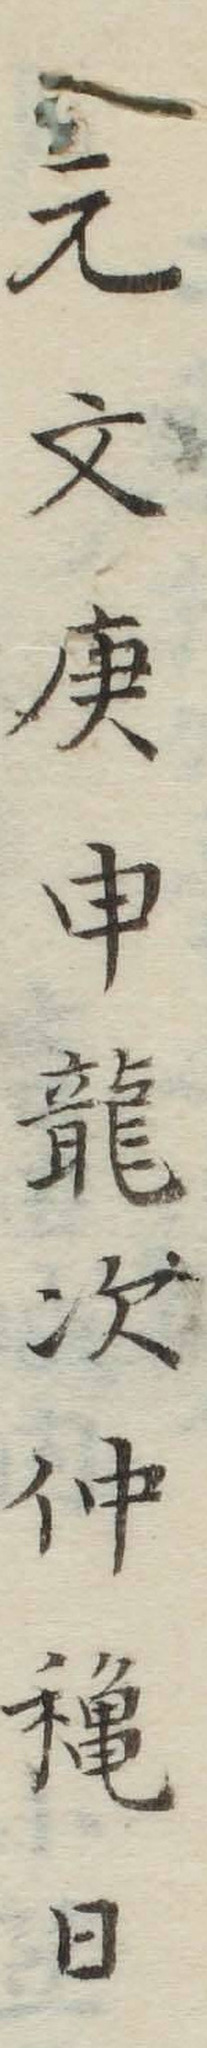元文庚申龍次仲穐日
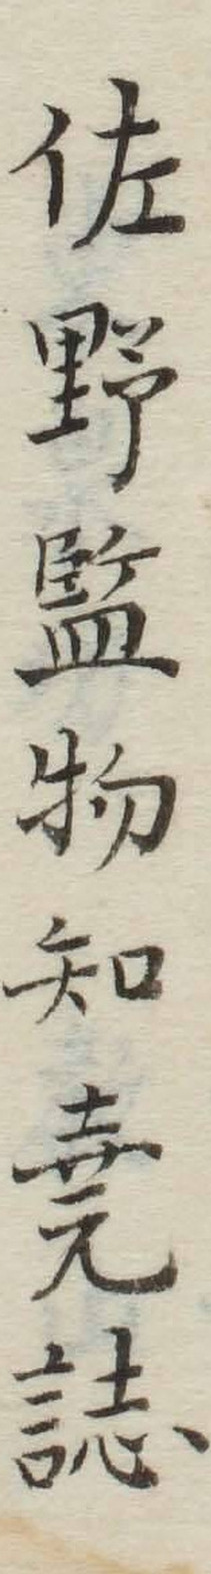佐野監物知尭誌

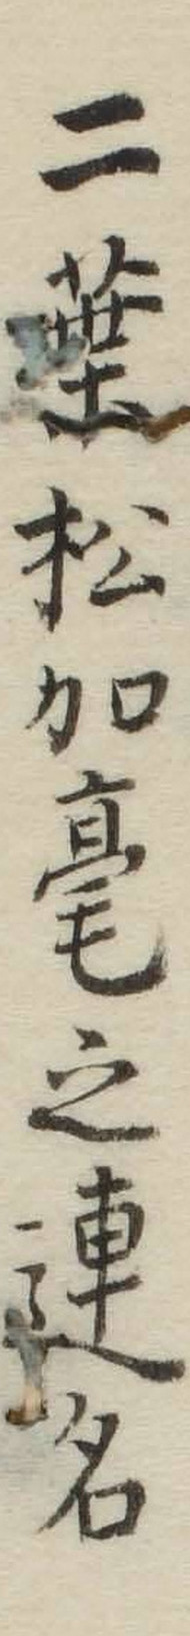二葉松加毫之連名
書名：三河国二葉松
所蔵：国文学研究資料館
